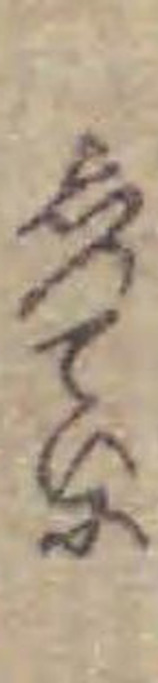しつていに
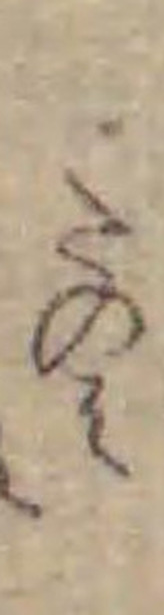たのみ

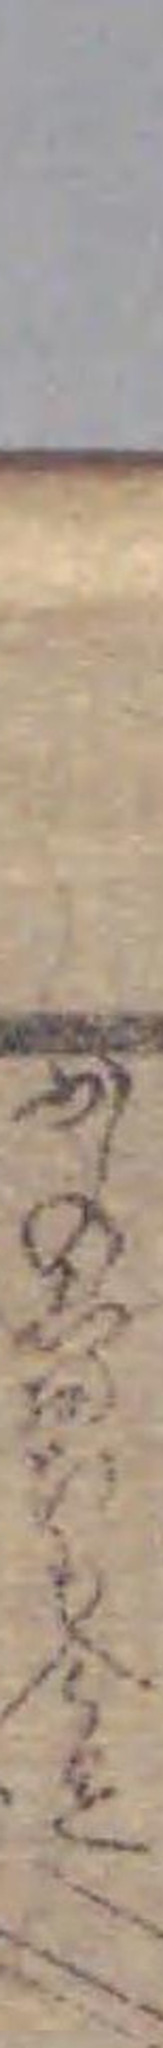少しのしまいも今迄
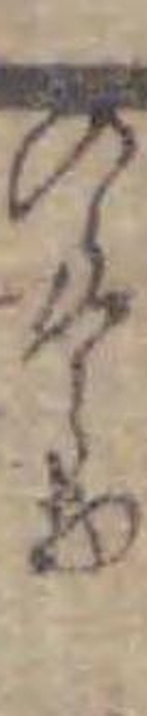のらくら物
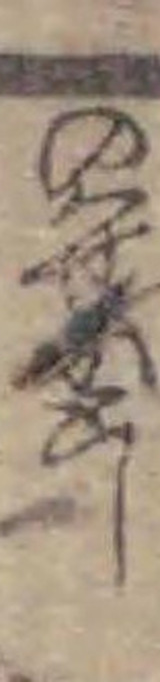のくせにとし
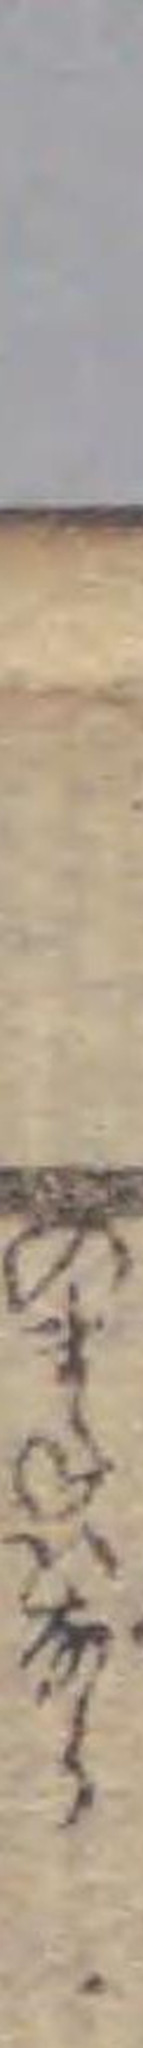のまねはなら
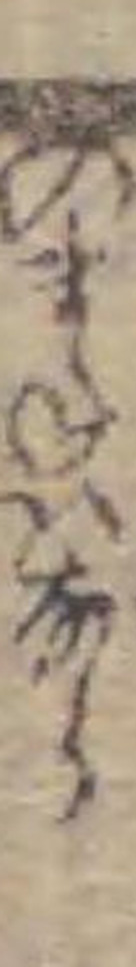のまねはなら
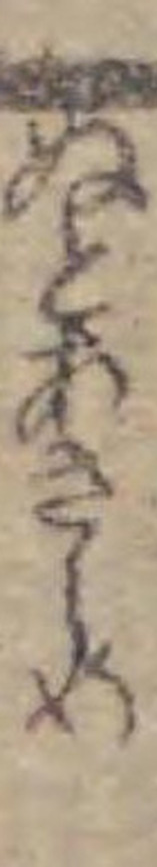ぬとあきらめ
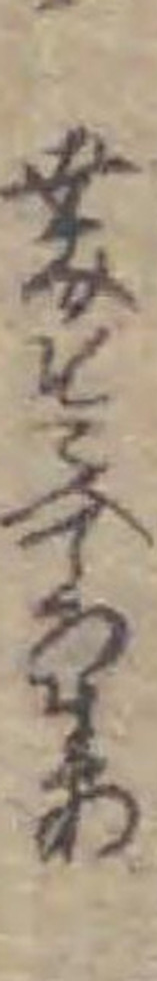幸介そこへてろまあ
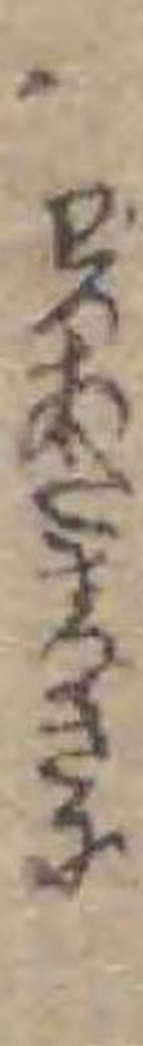わかあたまかきに
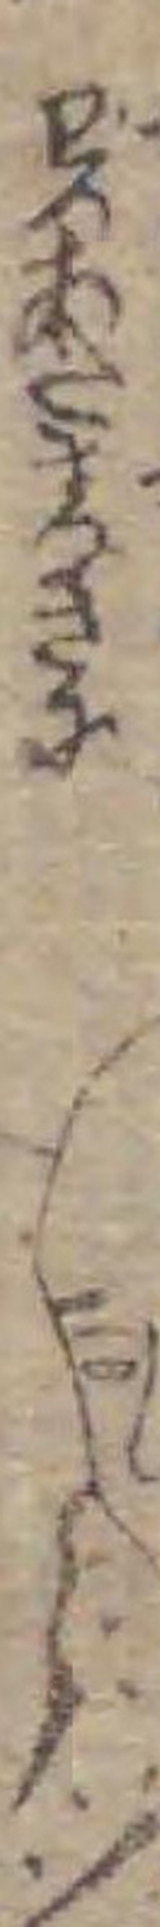わかあたまかきに
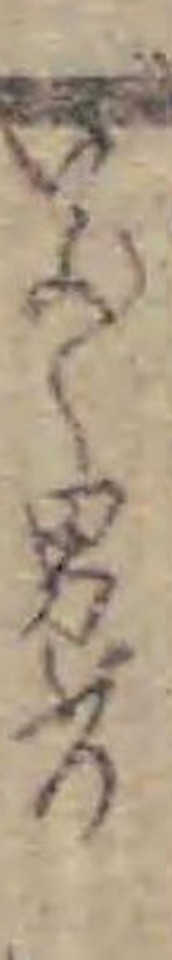いよ〳〵男ぶり
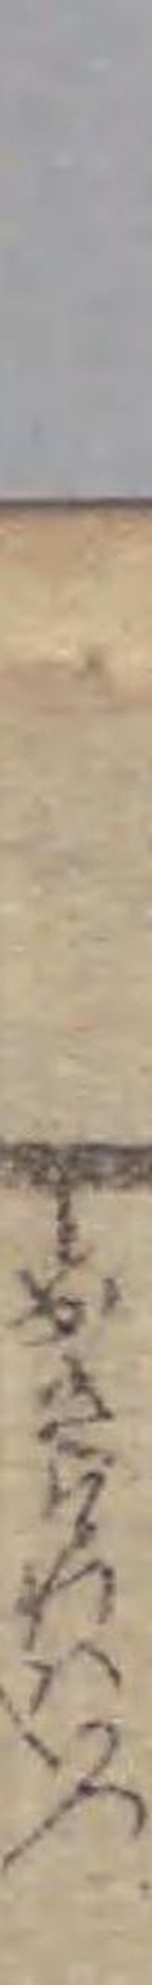みかきけれはいつ
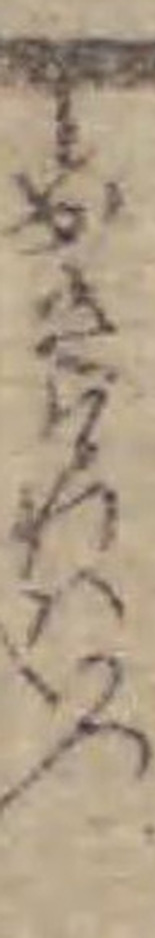みかきけれはいつ
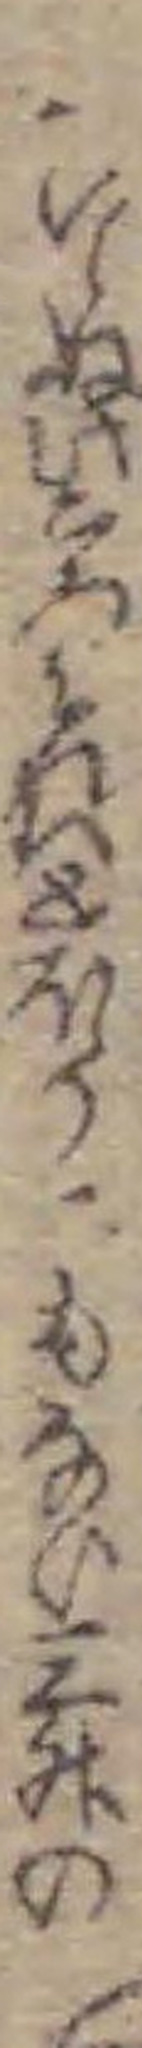いらぬ此ころわれはとほうもない三升の
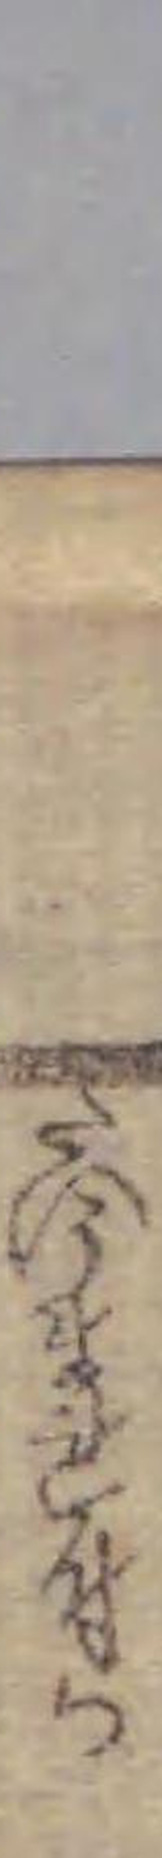たいうまれ付か
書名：通風伊勢物語 : 3巻
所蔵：国立国会図書館 National Diet Library, JAPAN
